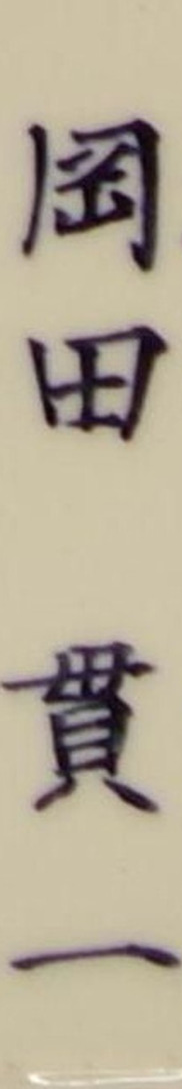岡田貫一
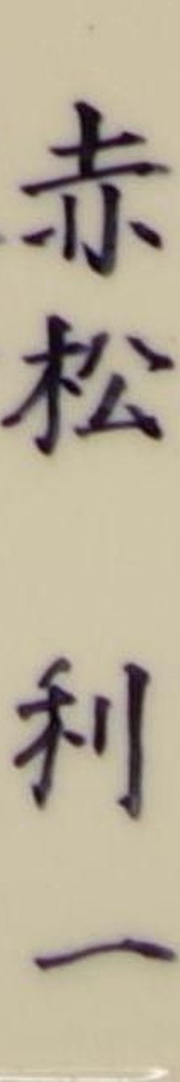赤松利一
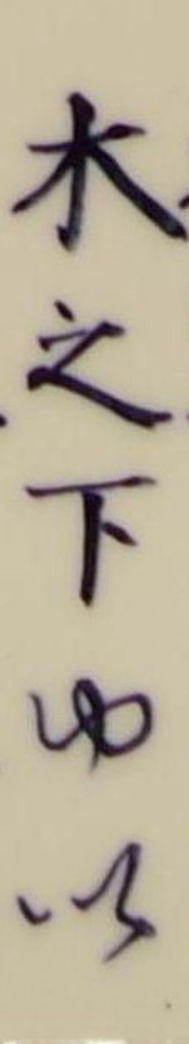木之下ゆい
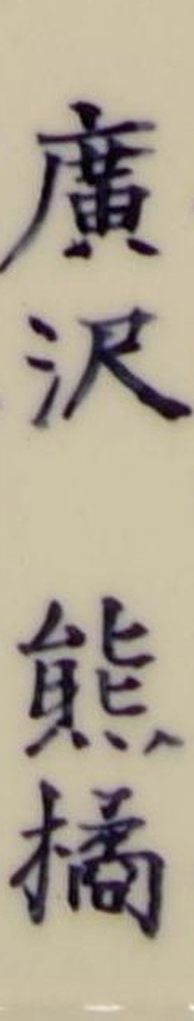廣沢熊橘
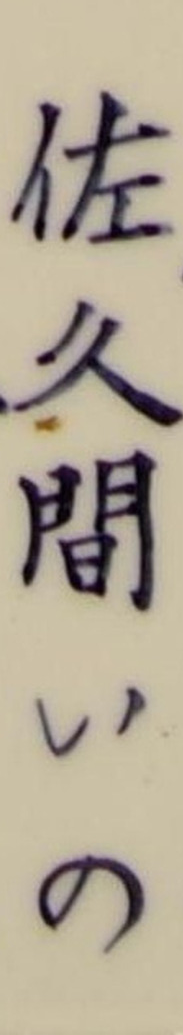佐久間いの
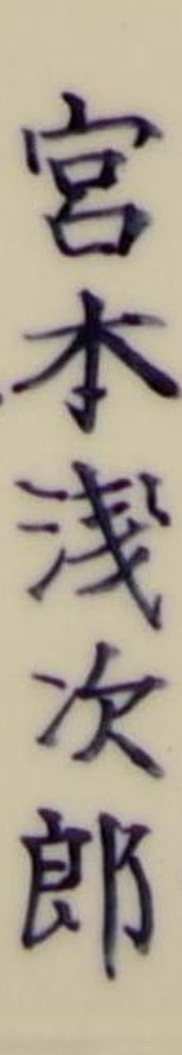宮本浅次郎
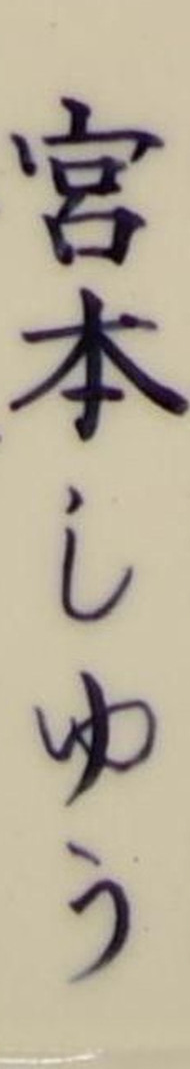宮本しゆう
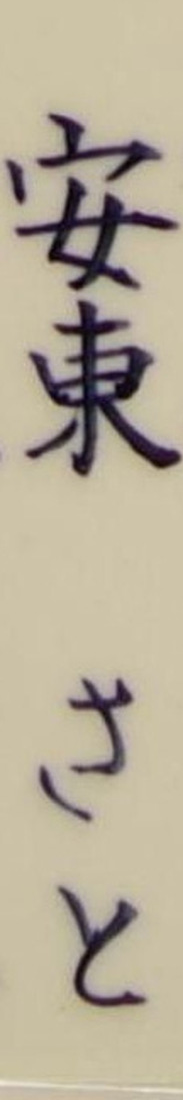安東さと
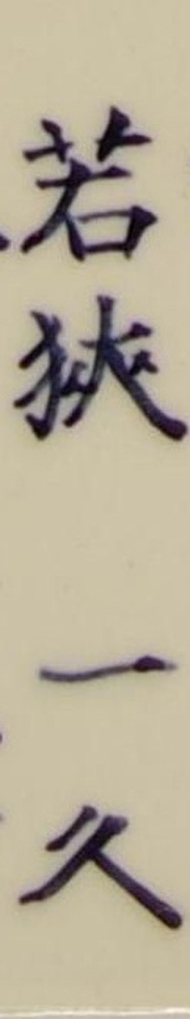若狭一久
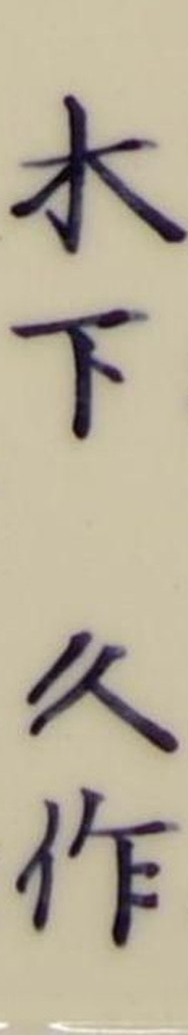木下久作
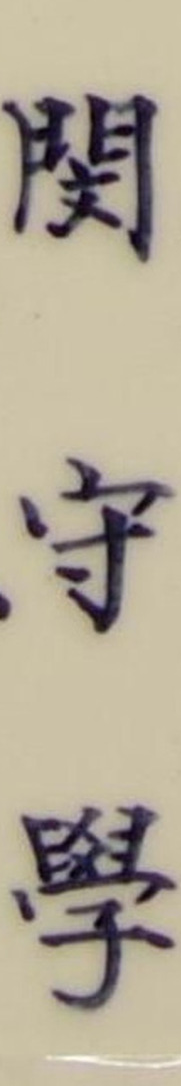関守学
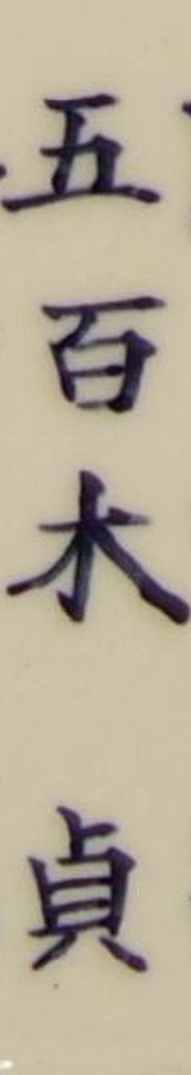五百木貞
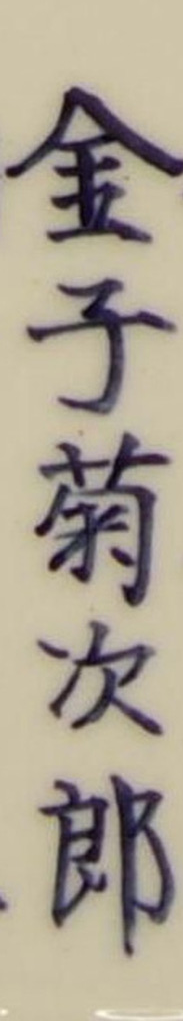金子菊次郎
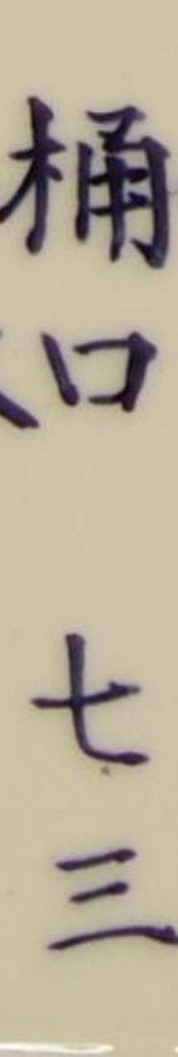桶口七三
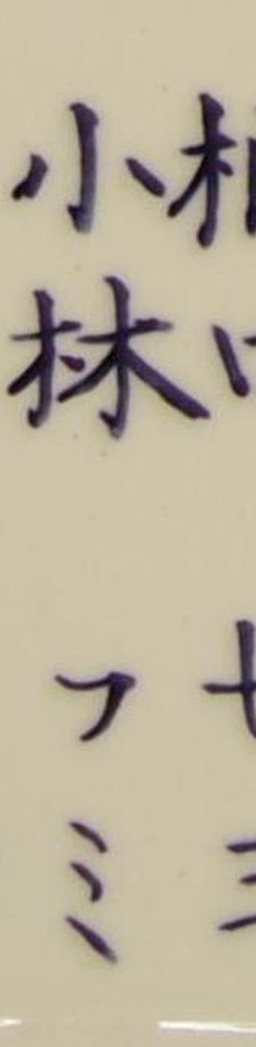小林フミ
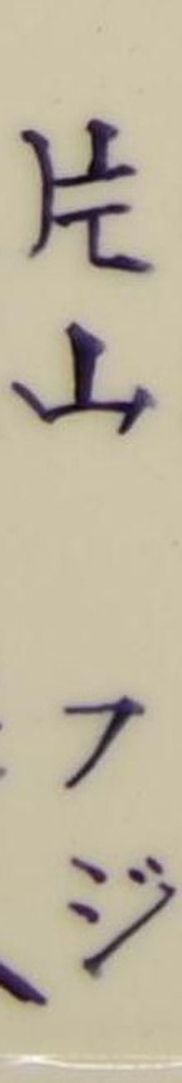片山フジ
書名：E~L
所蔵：高野山金剛峯寺
